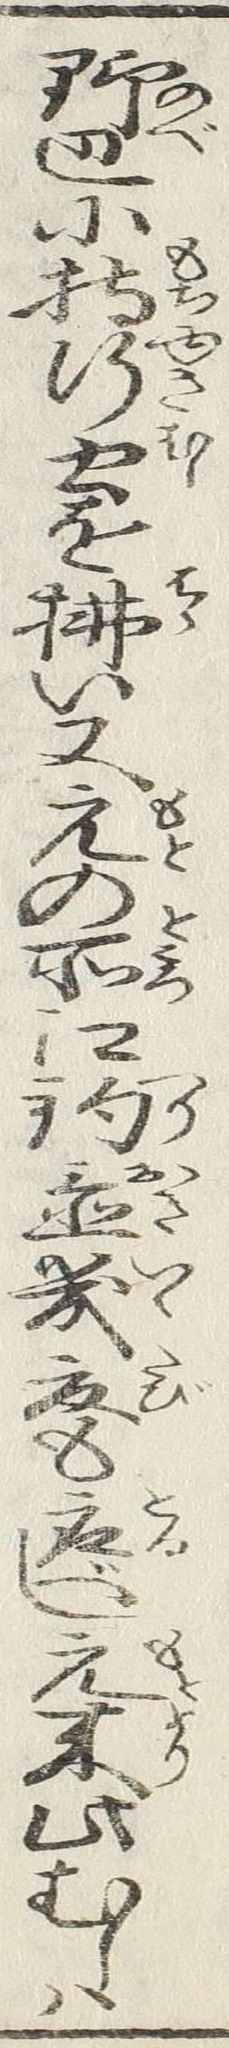野辺に持行虫を拂い又元の所え釣置幾度も取べし元来此むしは
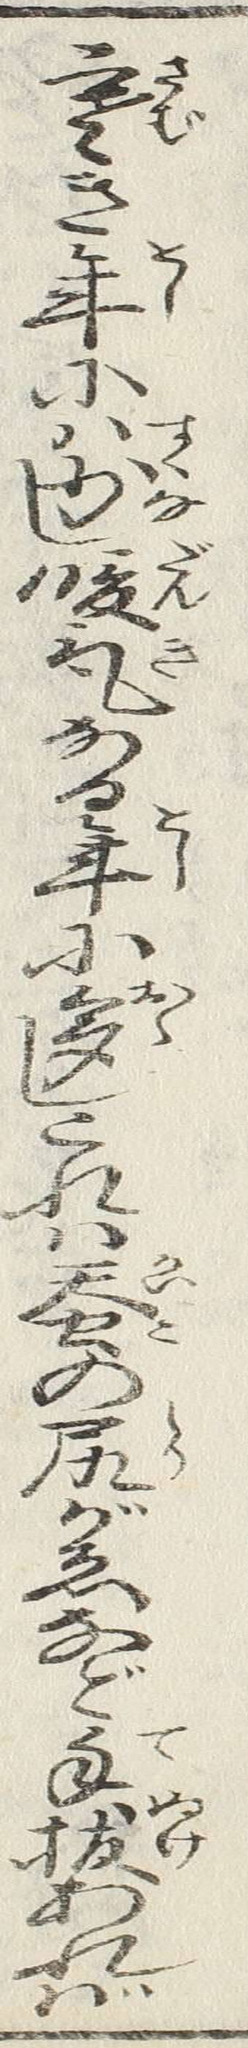寒き年には少し暖気なる年に多しこれは蚕の尻がゑなど手抜あれば
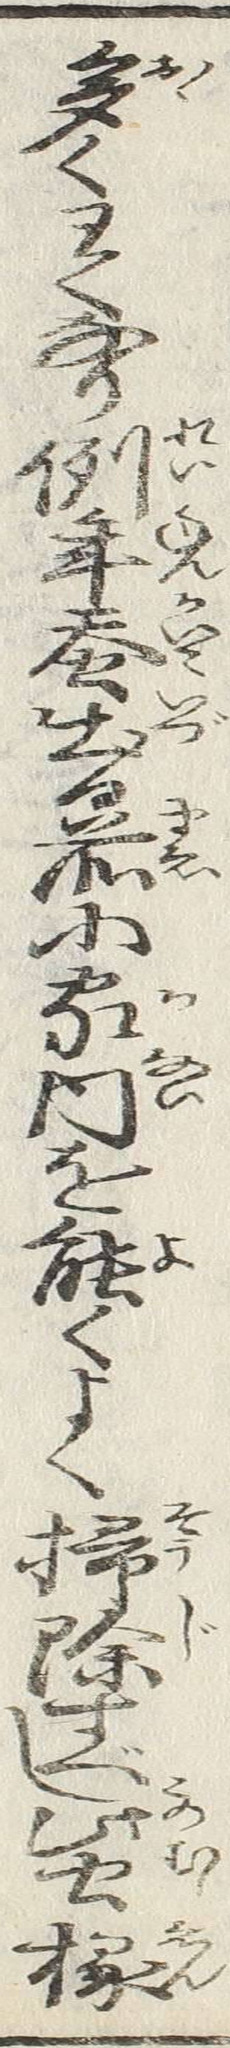多くわくなり例年蚕出る前に家内を能くよく掃除すべし此虫椽
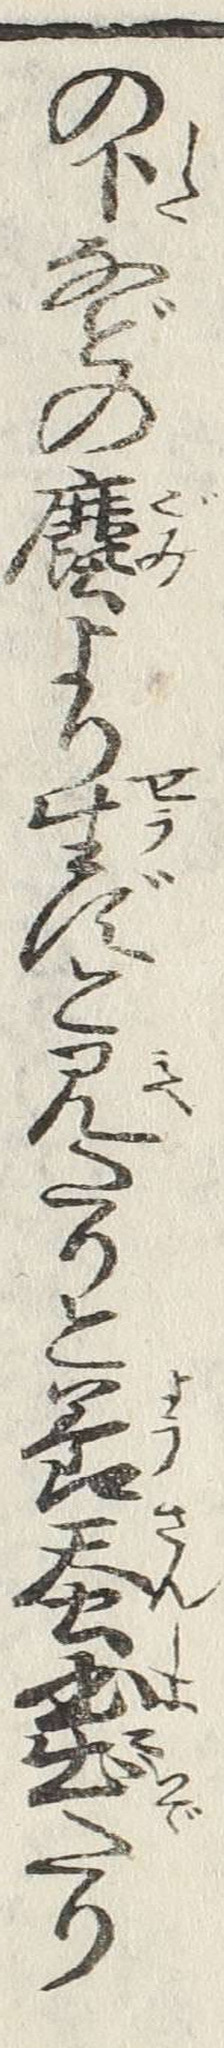の下などの塵より生ずと見たりと養蚕書に出たり
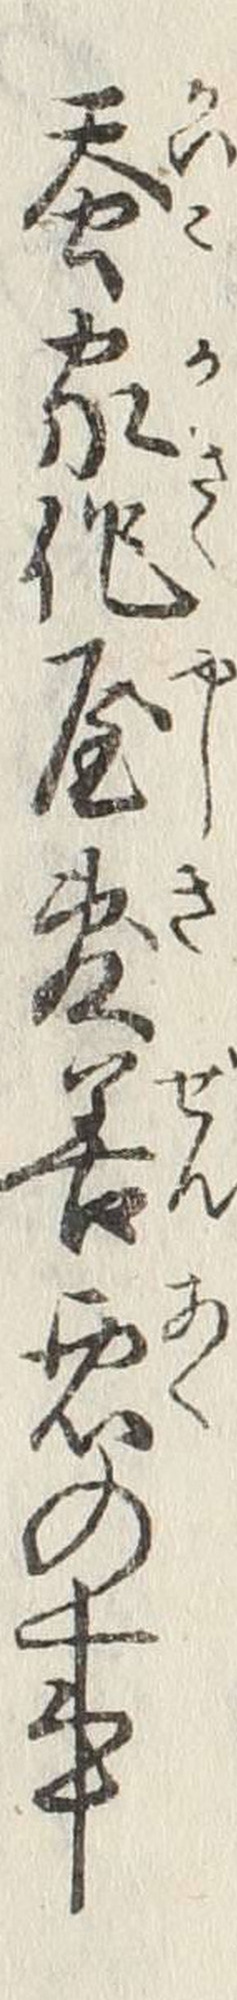蚕家作屋敷善悪の事
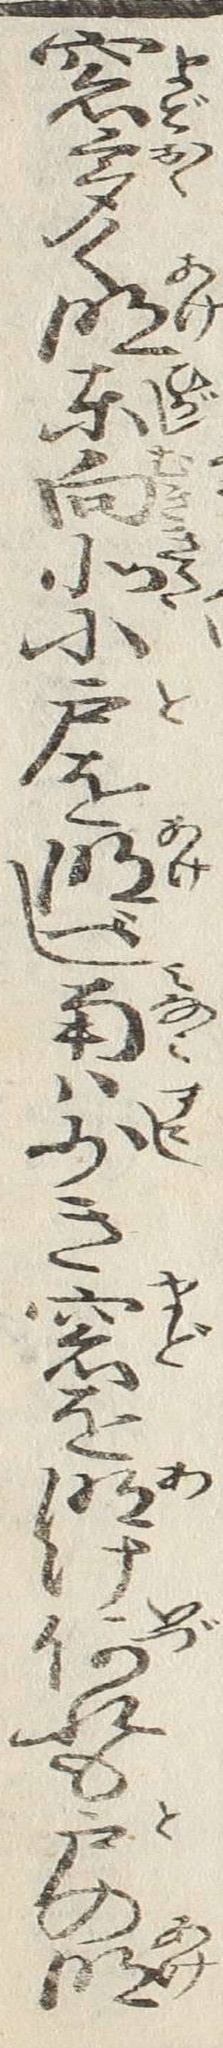窓多く明東向北に戸を明べし南は少き窓を明け何れも戸の明

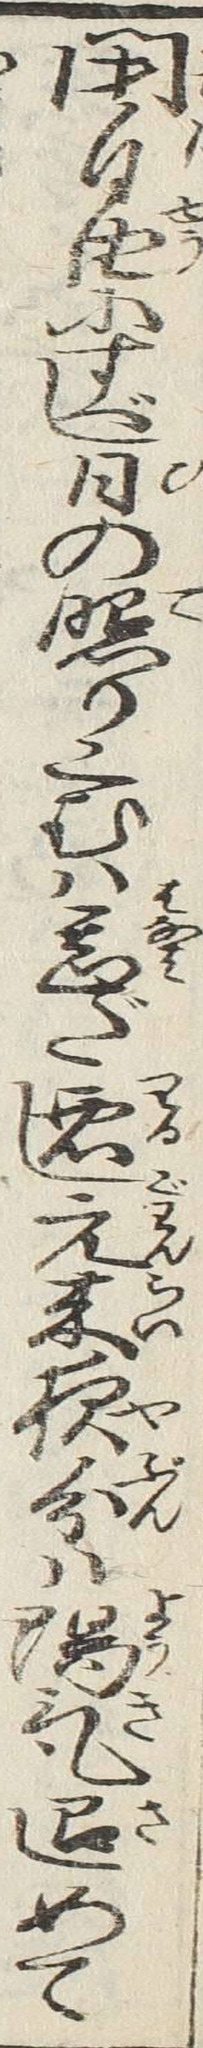閉自由にすべし日の照りこむは甚だ悪し元来夜分は陽気退めて
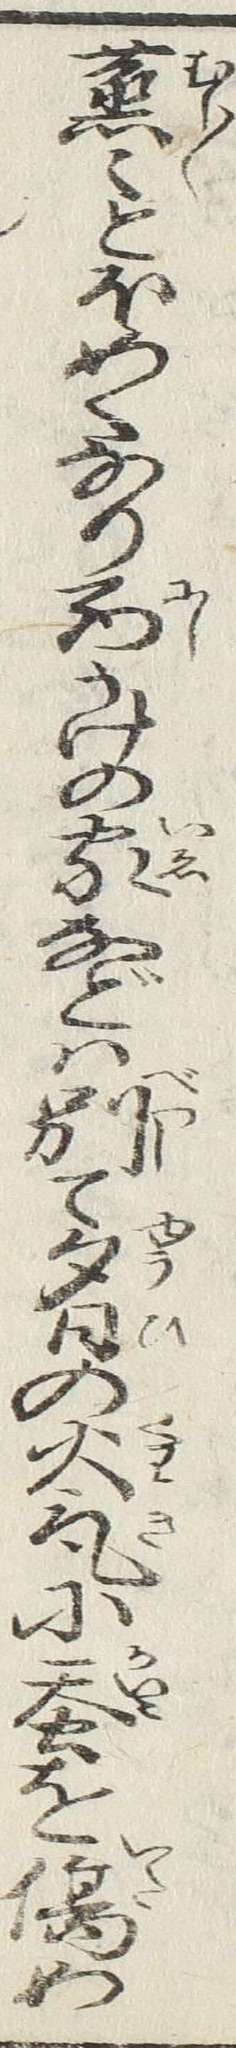蒸々とほめくなり西うけの家などは別て夕日の火気に蚕を傷め
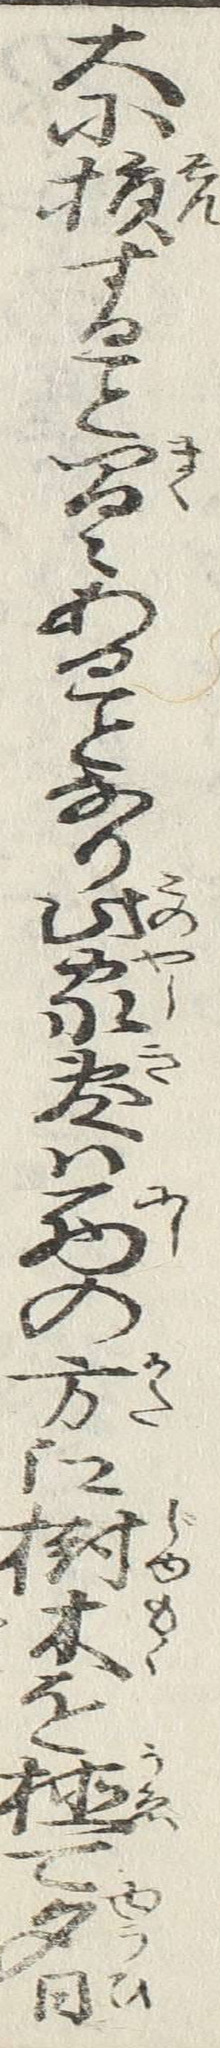大に損すること間々あることなり此家敷は西の方え樹木を植て夕日
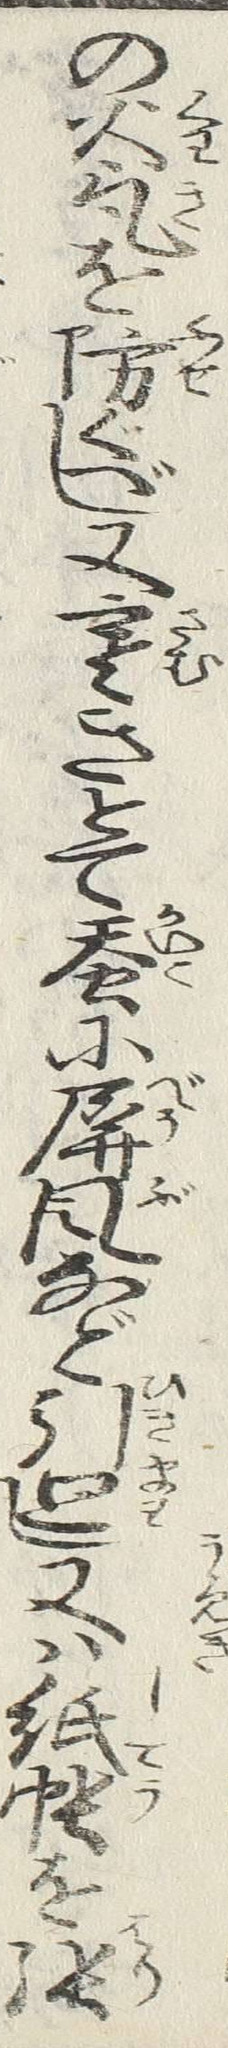の火気を防ぐべし又寒きとて蚕に屏風など引廻し又は紙帳を張
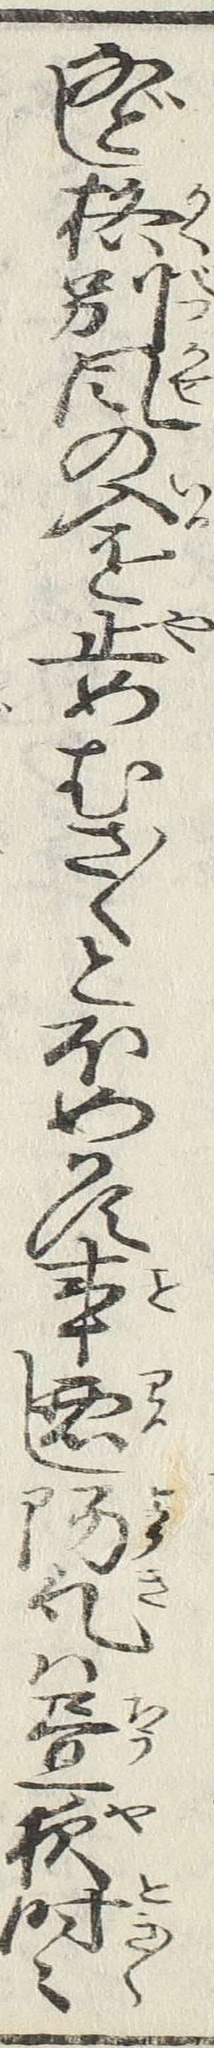などし格別風の入を止めむさ〳〵とほめかす事悪し陽気は昼夜時々
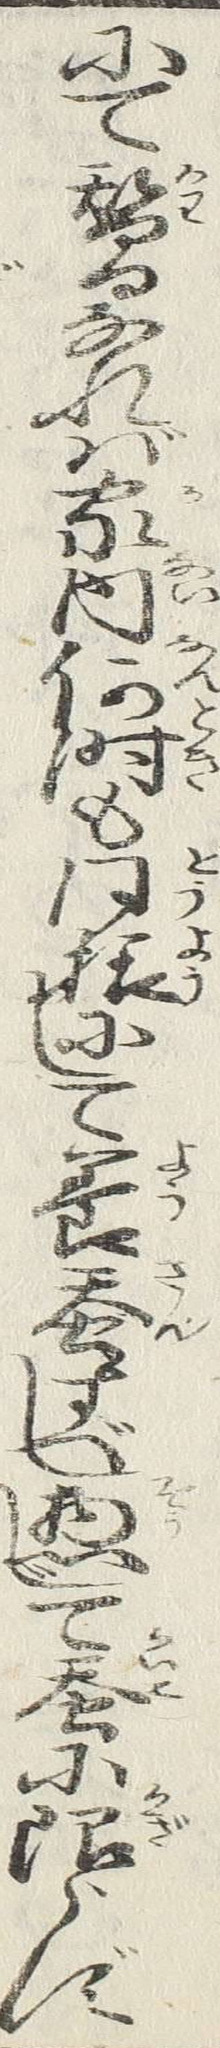にて替るなれば家内何時も同様にして養蚕すべし惣じて蚕に限らず
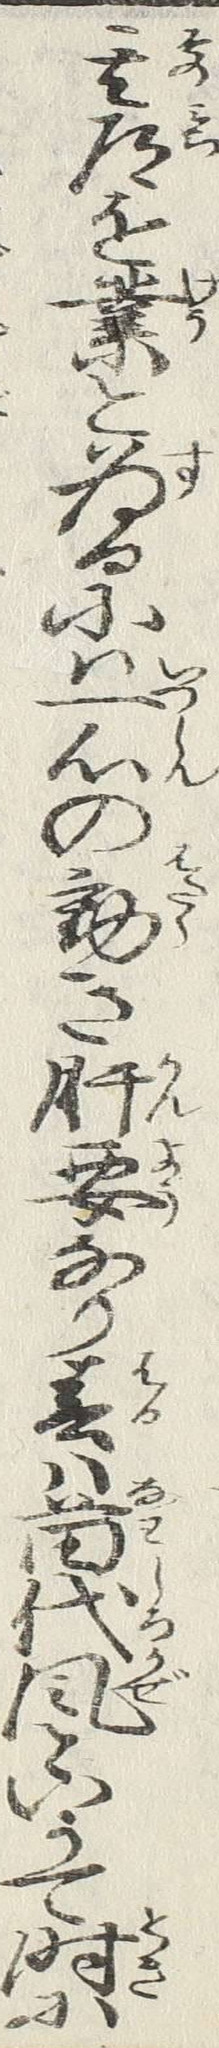其道を業と為るには一心の動き肝要なり春は苗代風というて時に
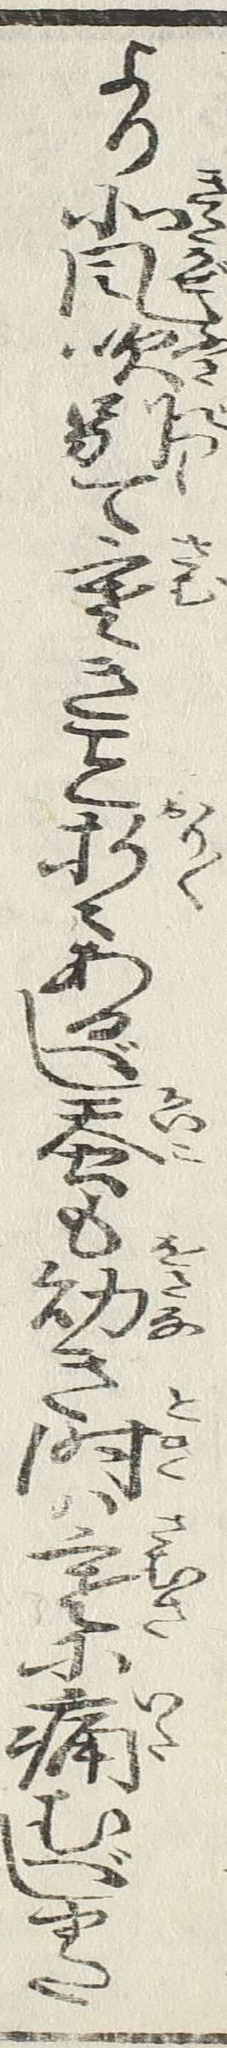より北風吹別て寒きこと折々あるべし蚕も幼き時は寒に痛むべしまた
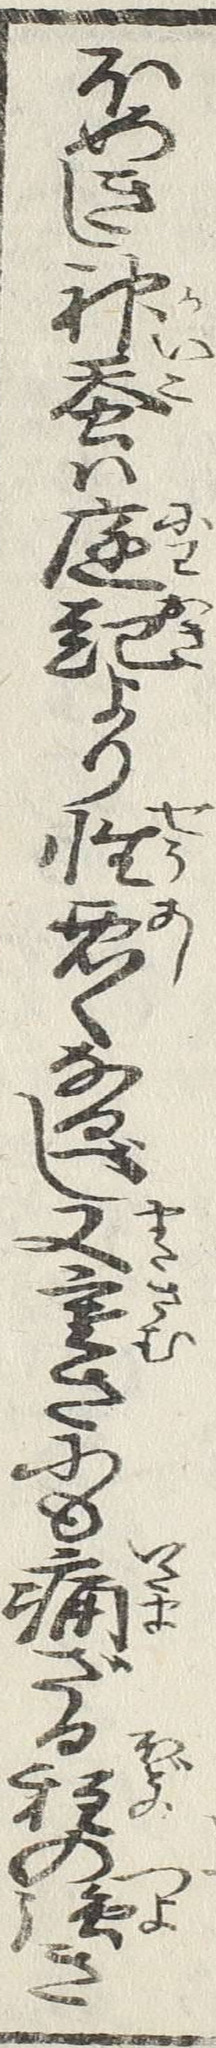ほめきし神蚕は庭起より性悪くなるべし又寒さにも痛ざる程の強き
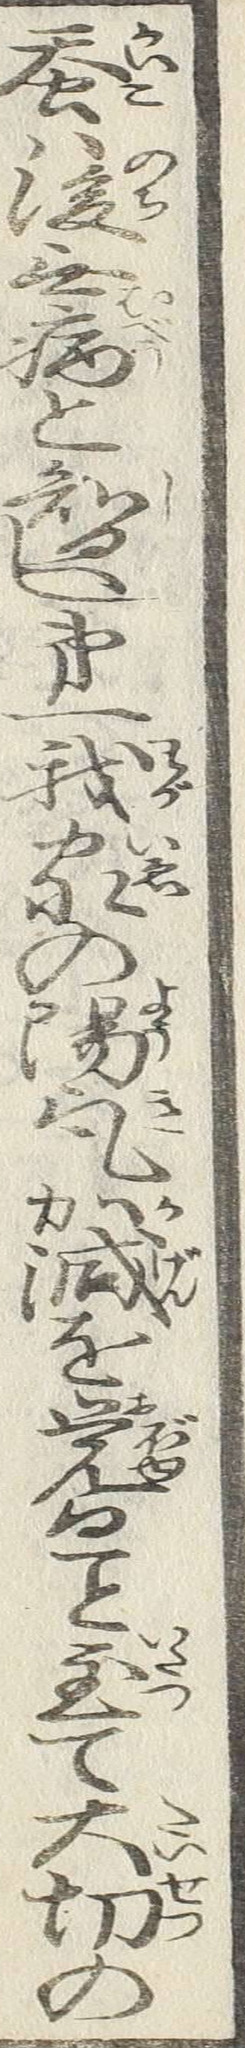蚕は後無病と知るへし第一我家の陽気加減を覚ること至て大切の
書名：養蠶實驗録
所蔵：東京大学農学生命科学図書館 国文学研究資料館
